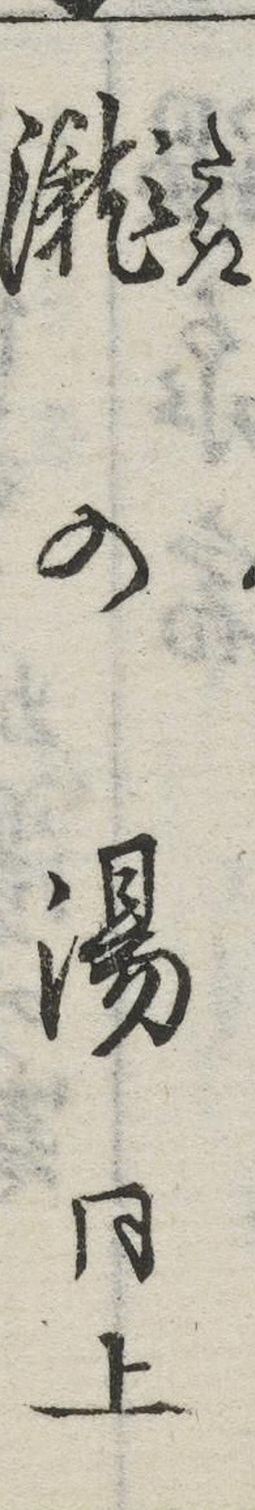滝の湯同上
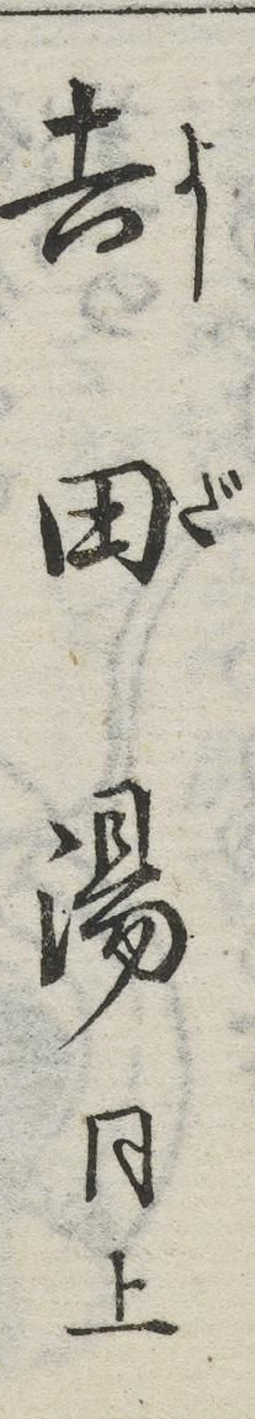吉田湯同上
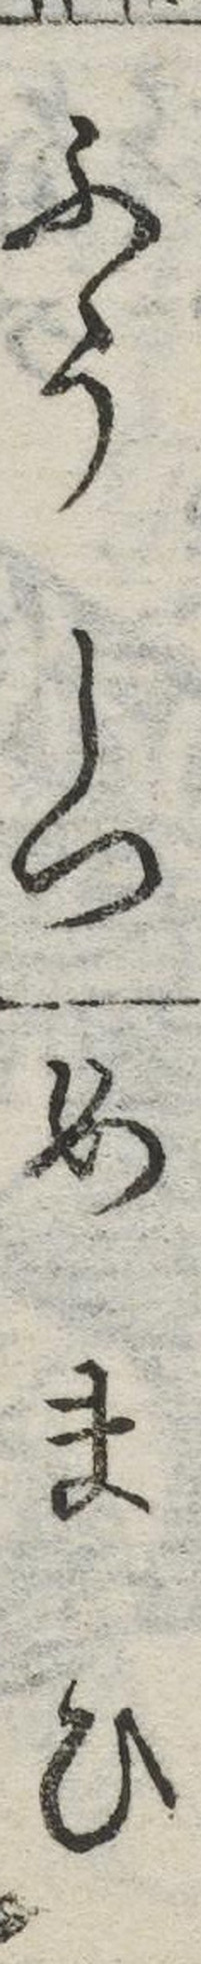ふうしつめまひ
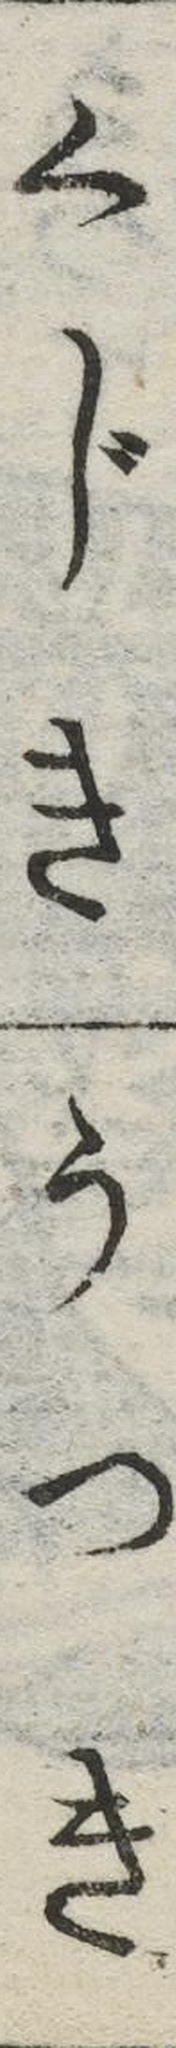くじきうつき
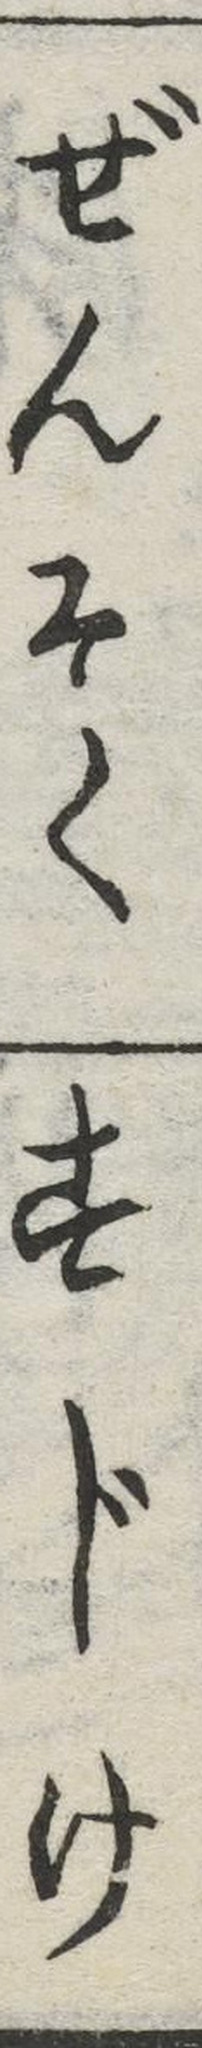ぜんそくすじけ
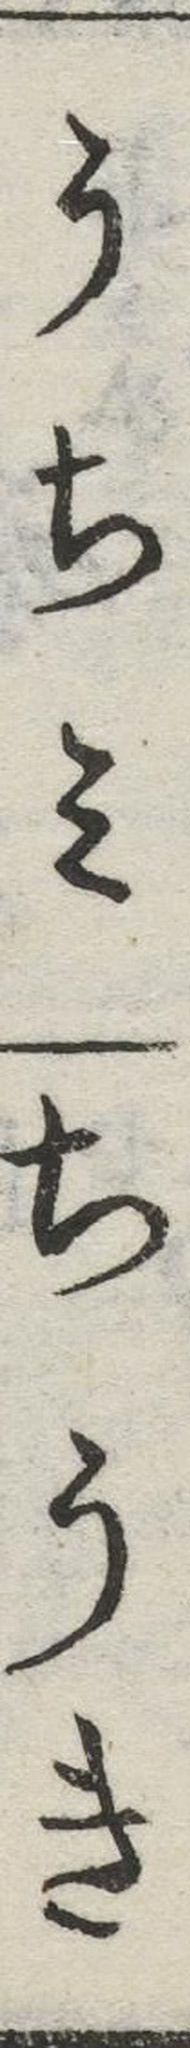うちみちうき
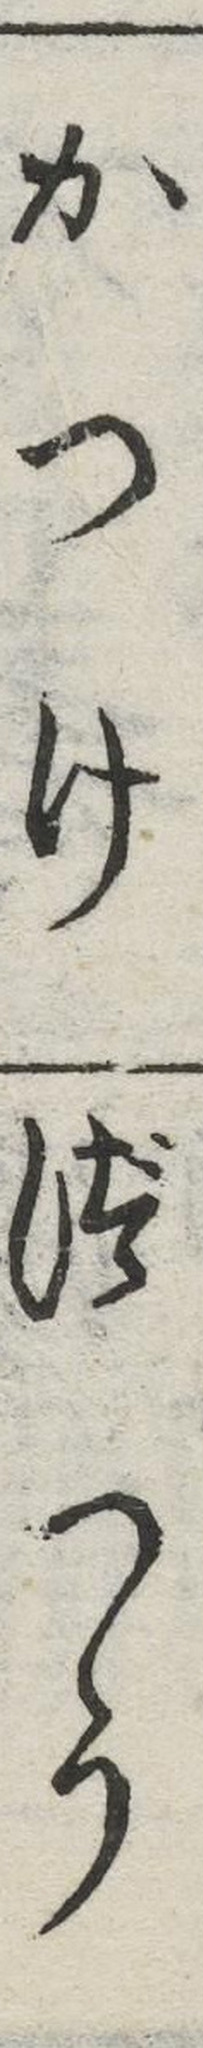かつけづつう
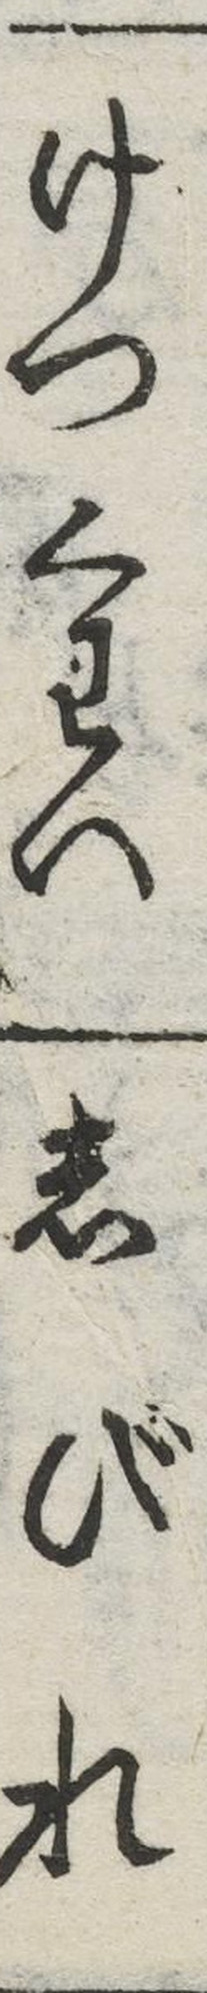けつくわいしびれ
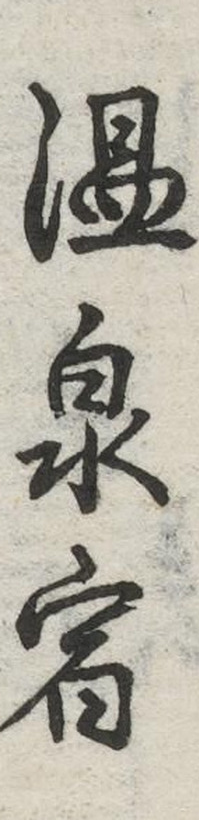温泉宿
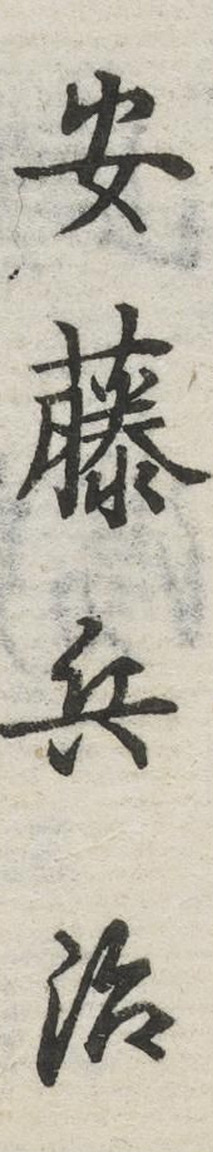安藤兵治
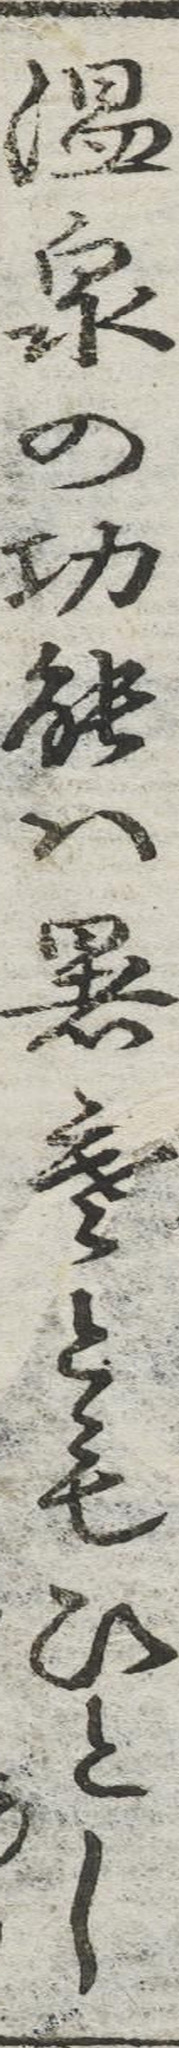温泉の功能は暑寒ともひとし
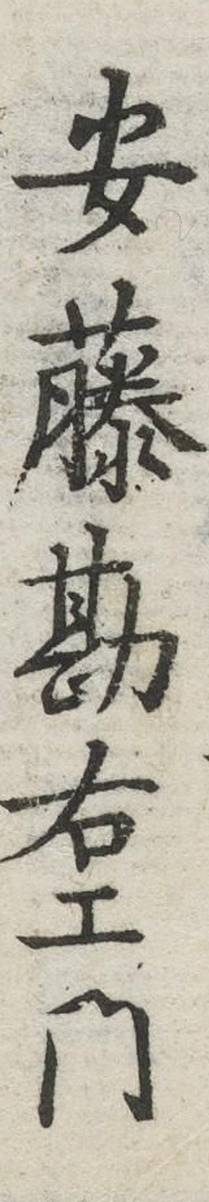安藤勘右エ門
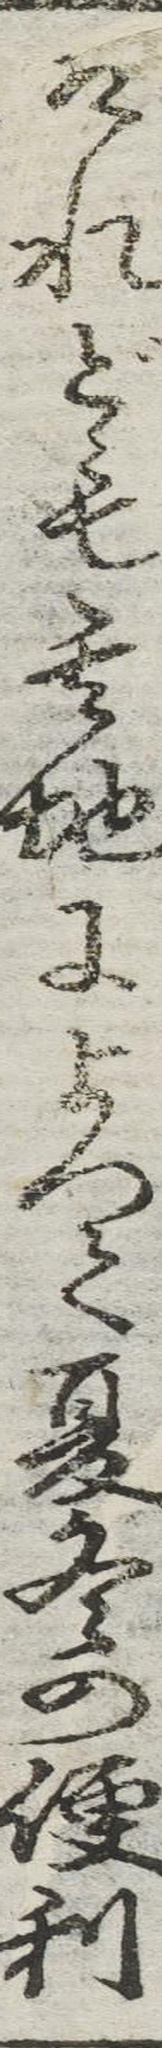けれども其地によつて夏冬の便利
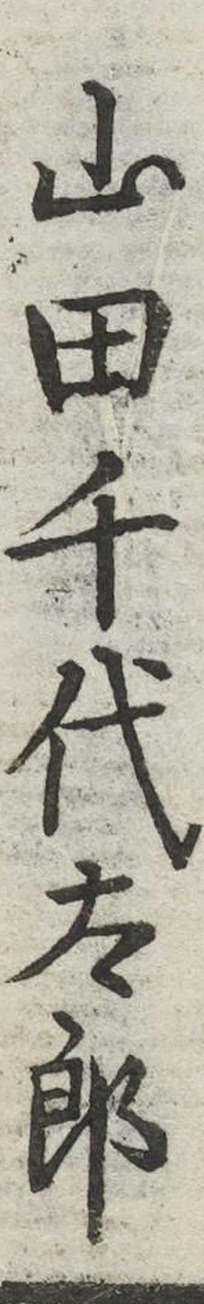山田千代太郎
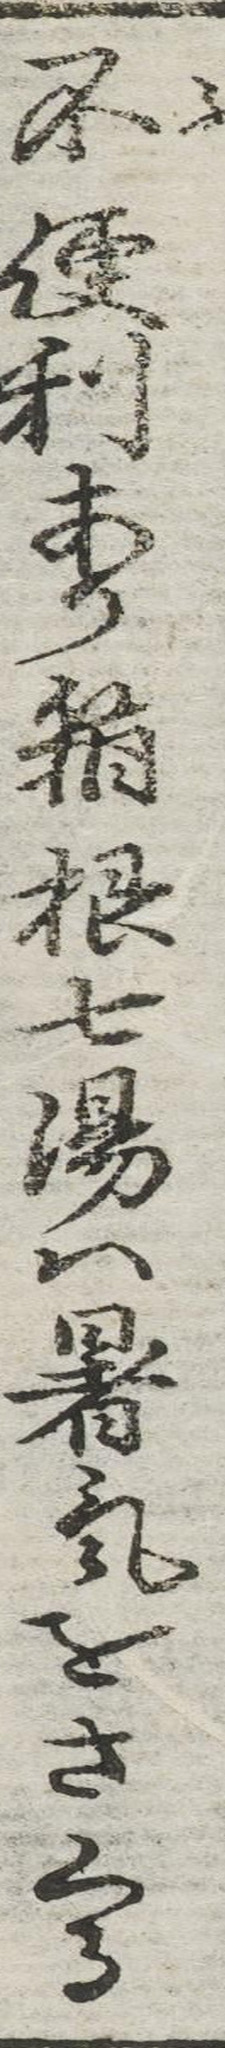不便利あり箱根七湯は暑気をさくる
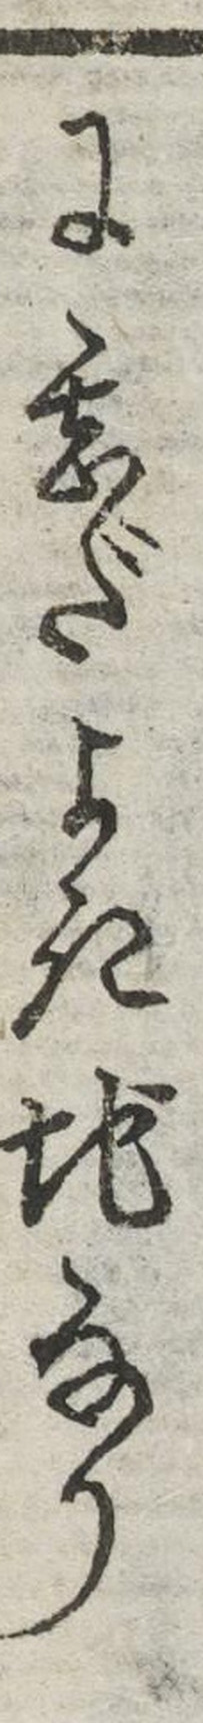に甚だよき地なり
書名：諸國温泉遊覽記　全
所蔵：東京大学地震研究所図書室 Earthquake Research Institute Library, The University of Tokyo, JAPAN
